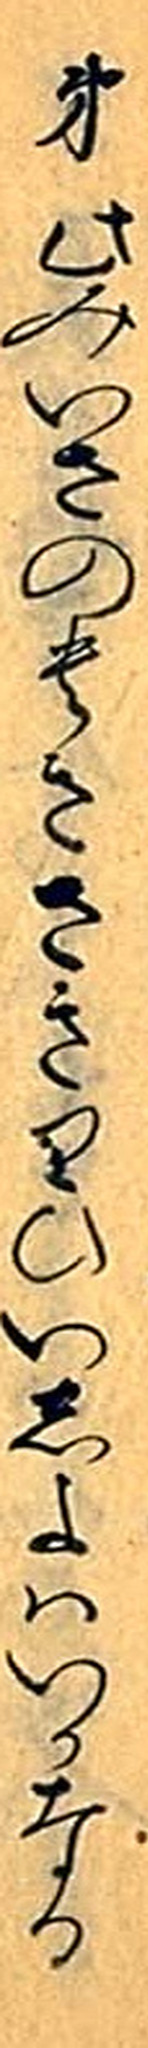弟此みいさの貴きさきりひいしよはいかなる
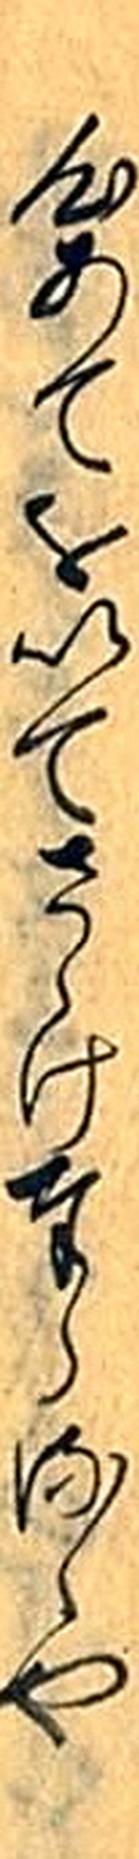心あてを以てさゝけ奉らるゝや
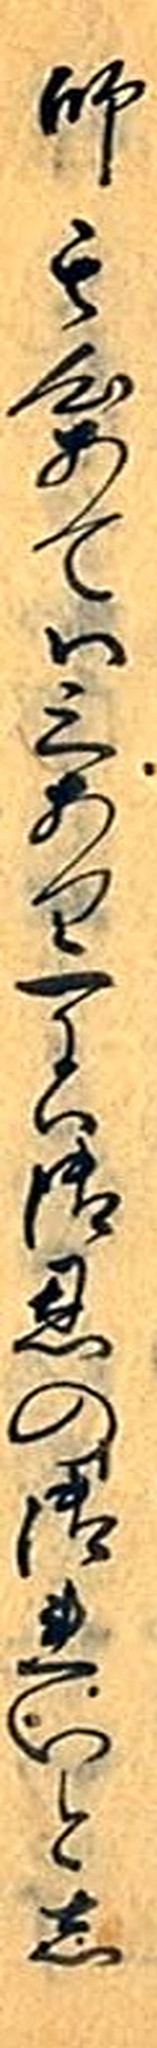師其心あては三あり一には御恩の御れいとし
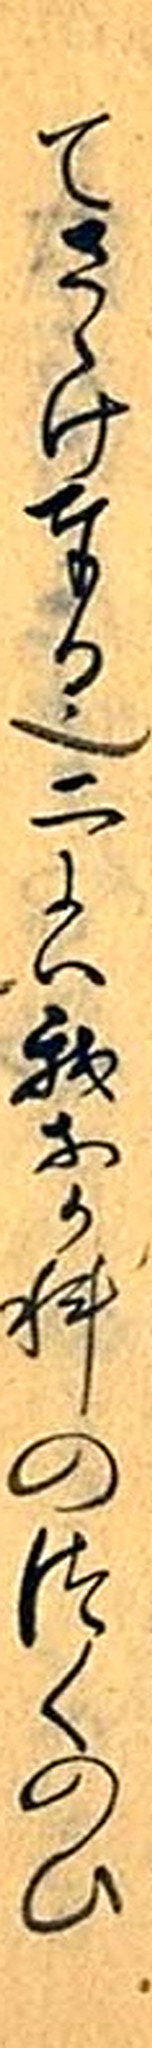てさゝけ奉る也二には我等か科のつくのひ
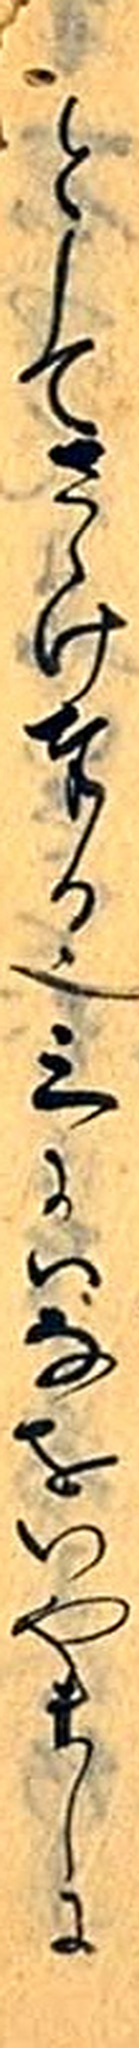としてさゝけ奉る也三にはなをいやましに
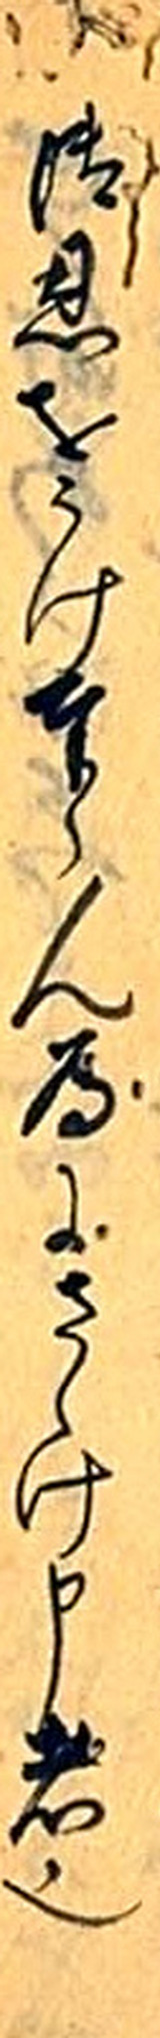御恩をうけ奉らん為にさゝけ申者也
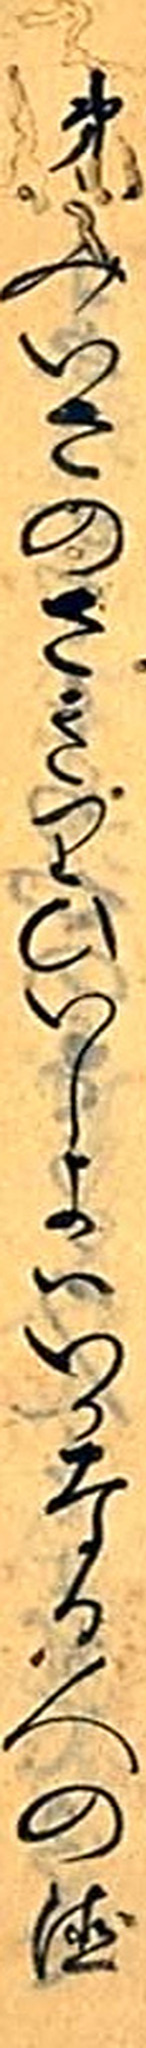弟みいさのさきりひいしよはいかなる人の徳
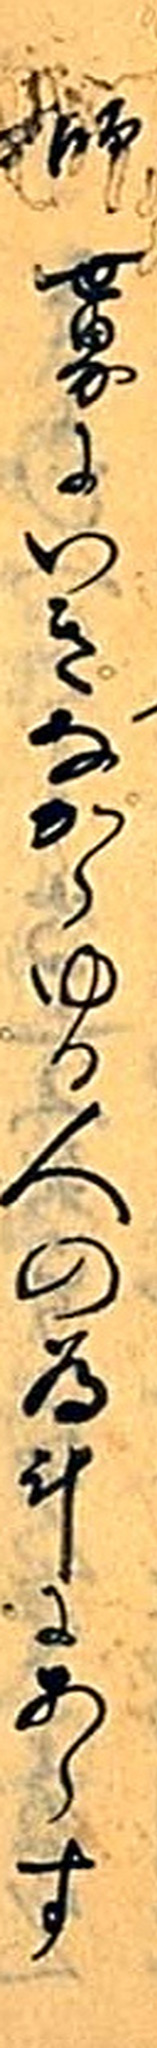師世界にいきなからゆる人の為計にあらす
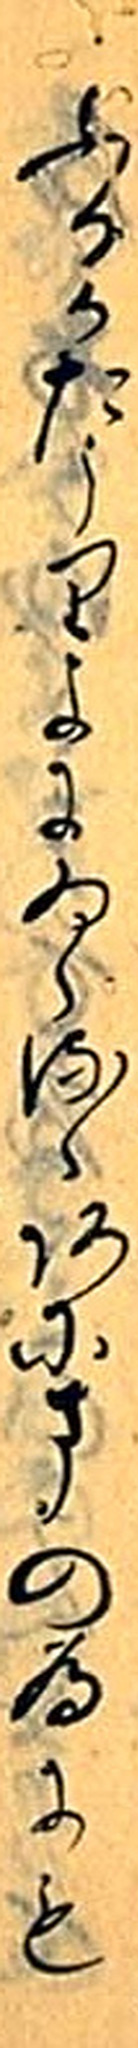ふるかたうりよにゐらるゝあにまの為にも
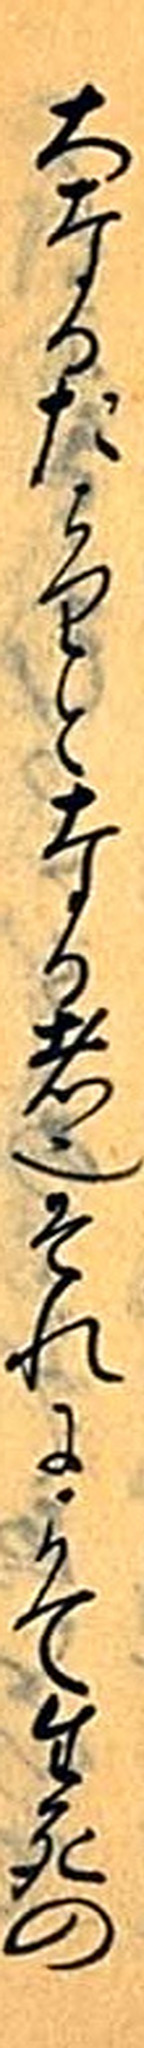大なるたよりとなる者也それによて生死の
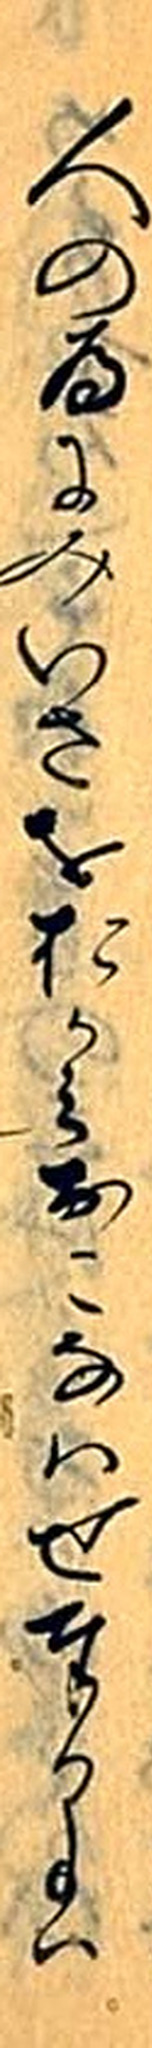人の為にみいさをおかみおこなはせ奉る事は
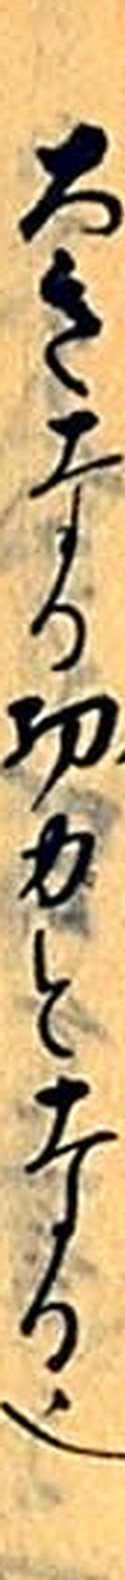大きなる功力となる也
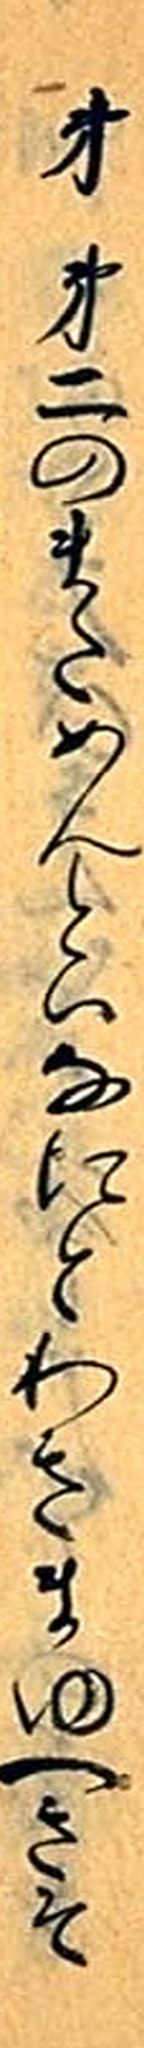弟第二のまためんとはなにとわきまゆへきそ
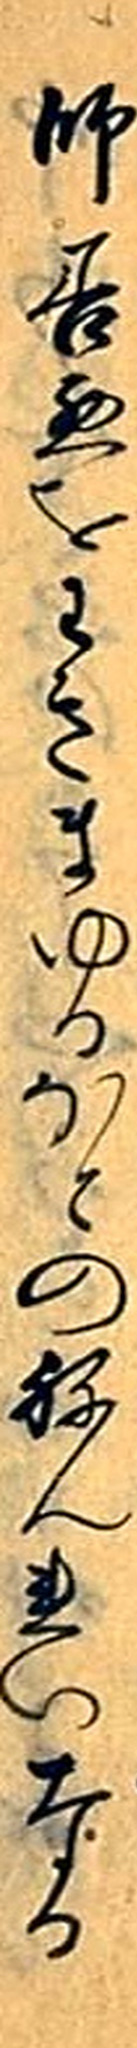師善悪をわきまゆるほとのねんれいなる
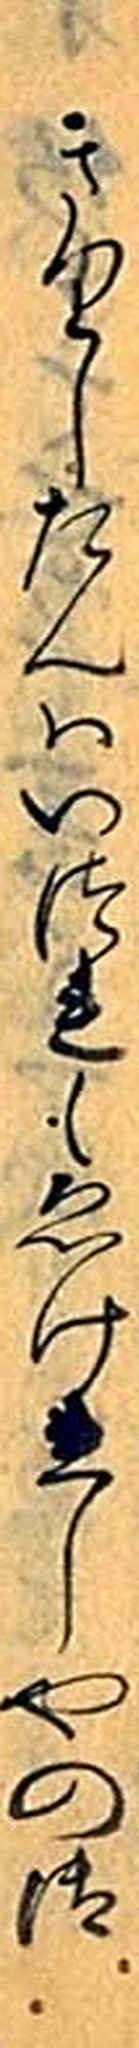きりしたんはいつれもゑけれしやの御
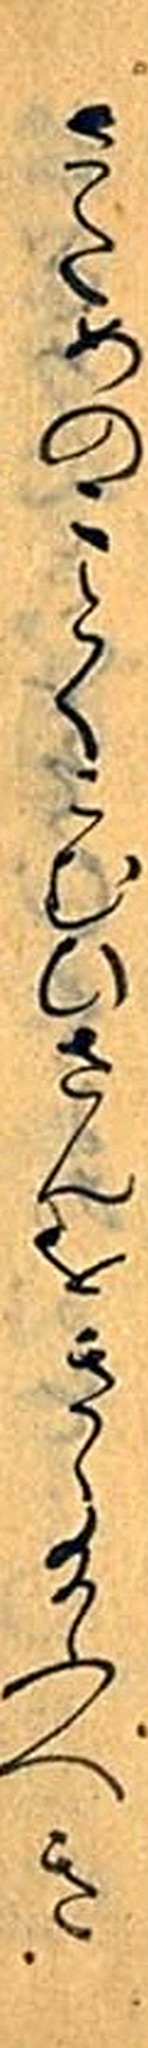さためのことくこむひさんをきゝ給ふへき
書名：ドチリナ・キリシタン
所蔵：東京大学総合図書館 / General Library in the University of Tokyo
